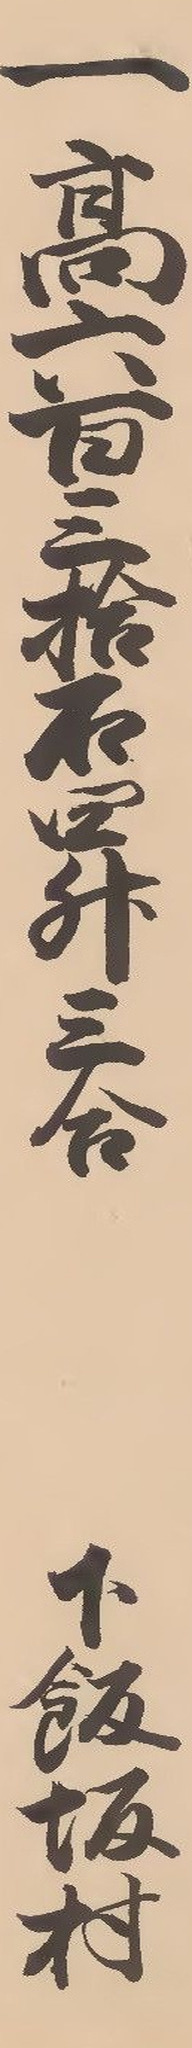一高六百三拾石四斗三升下飯坂村
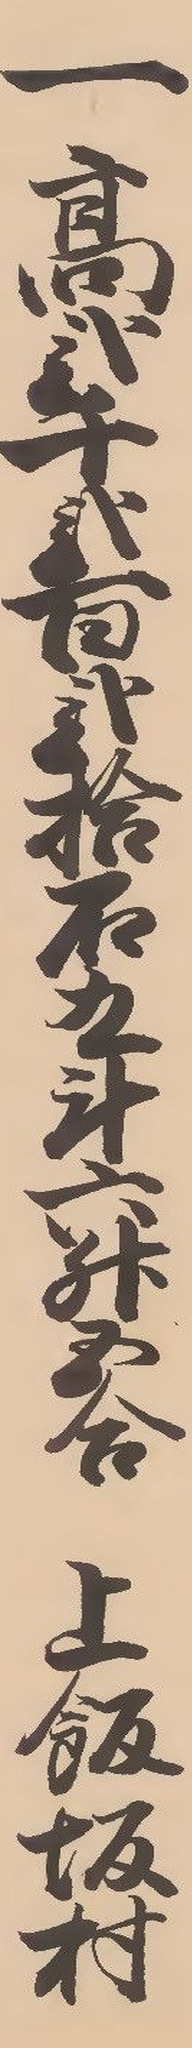一高弐千弐百弐拾石九斗六升五合上飯坂村
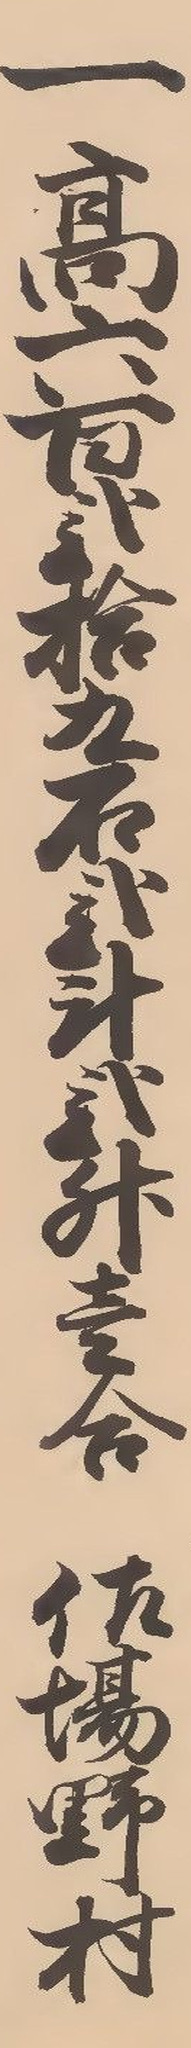一高六百弐拾九石弐斗弐升壱合佐場野村
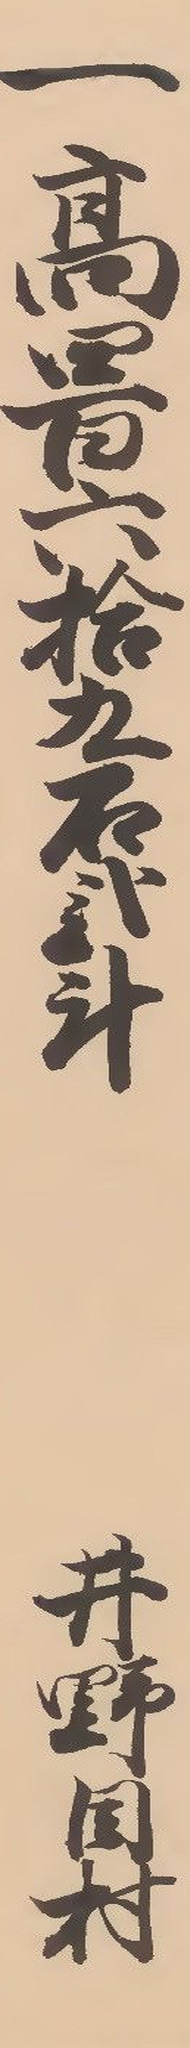一高四百六拾九石弐斗井野目村

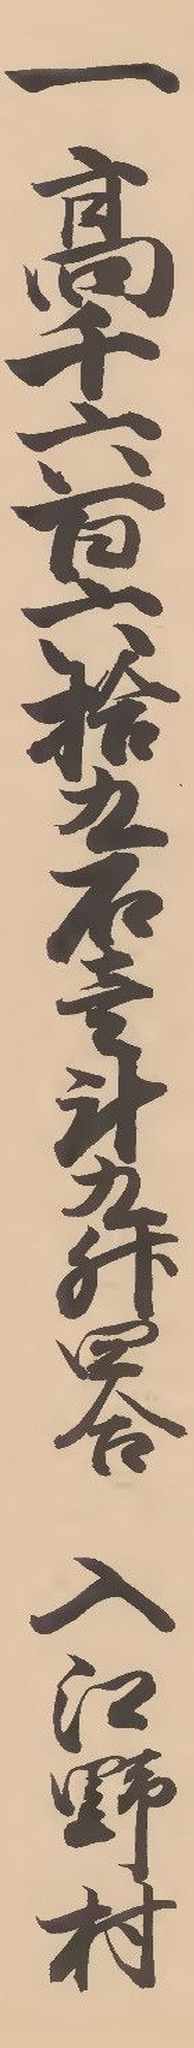一高千六百六拾九石壱斗九升四合入江野村
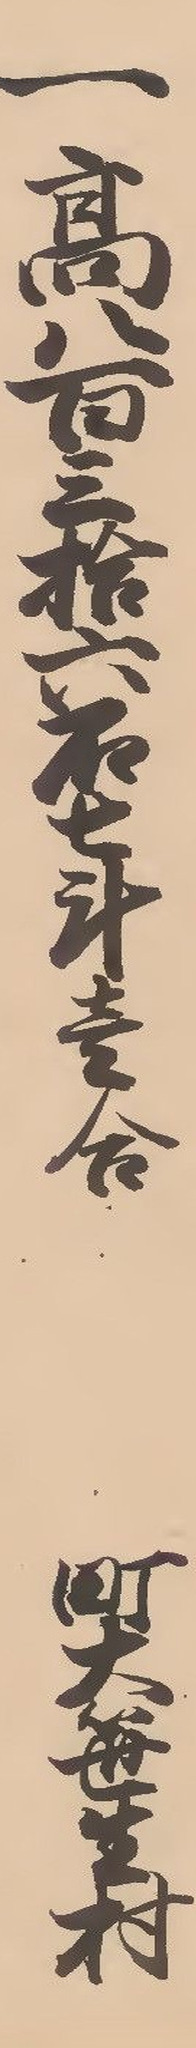一高八百三拾六石七斗壱合町大笹生村
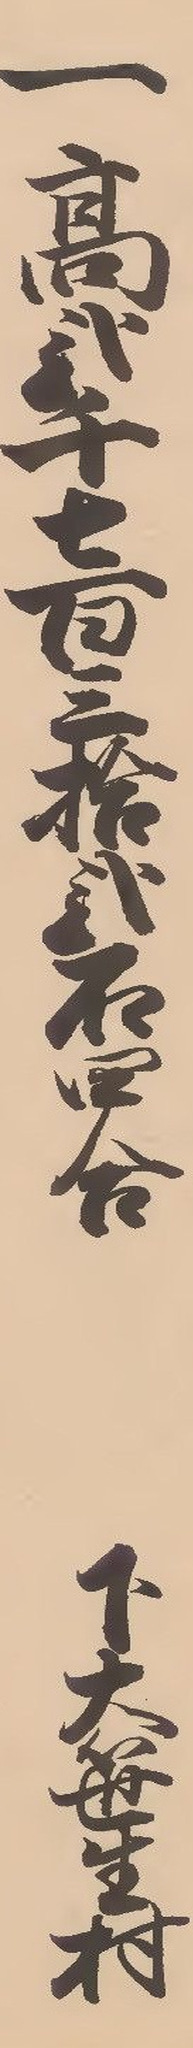一高弐千七百三拾弐石四合下大笹生村
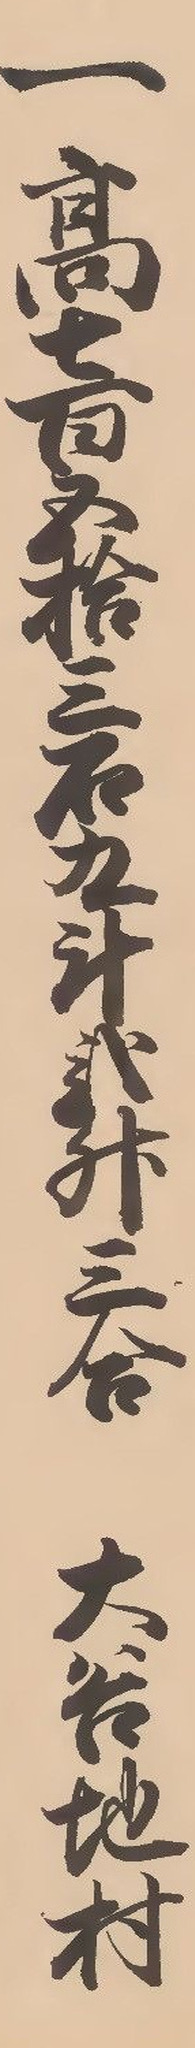一高七百五拾三石九斗弐升三合大谷地村
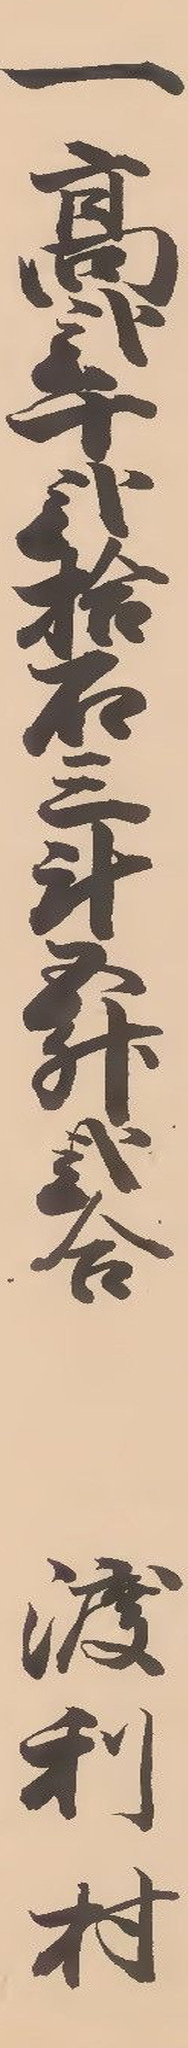一高弐千弐拾石三斗五升弐合渡利村
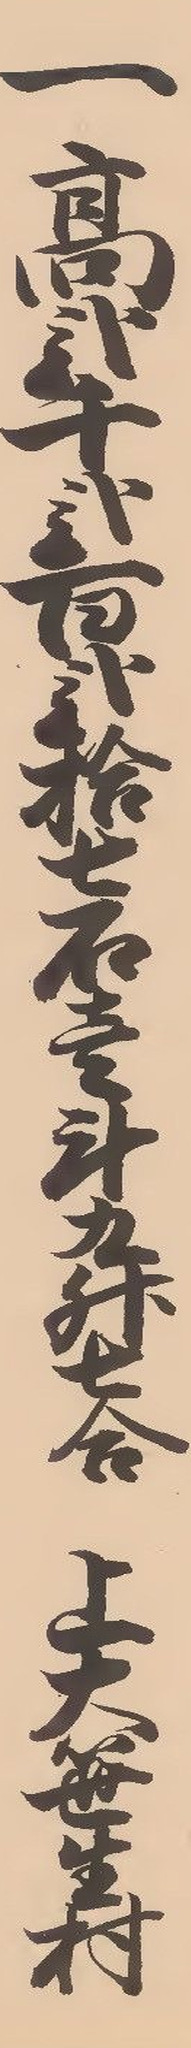一高弐千弐百弐拾七石壱斗九升七合上大笹生村
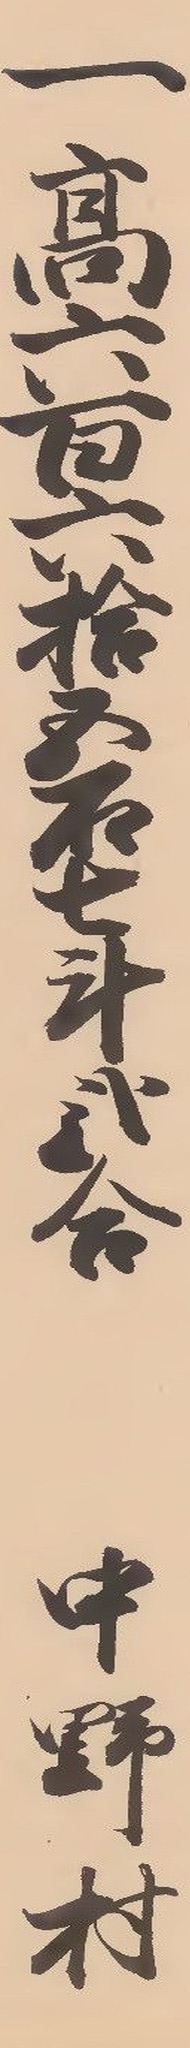一高六百六拾五石七斗弐合中野村
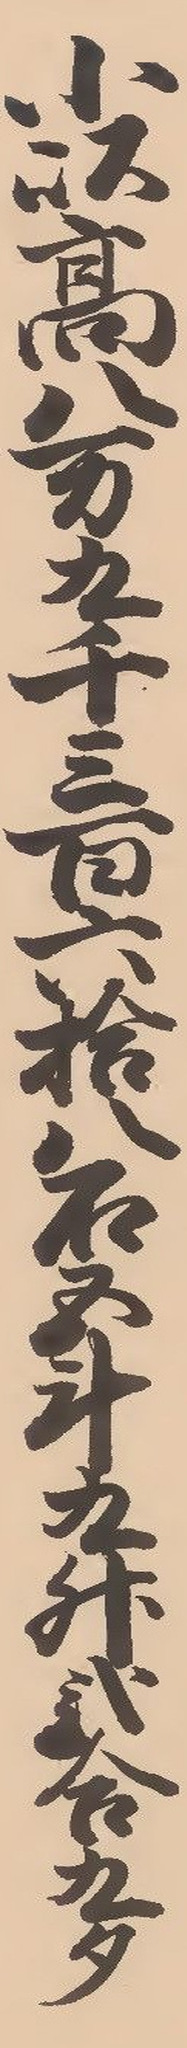小以高八万五千三百六拾八石五斗九升弐合九勺

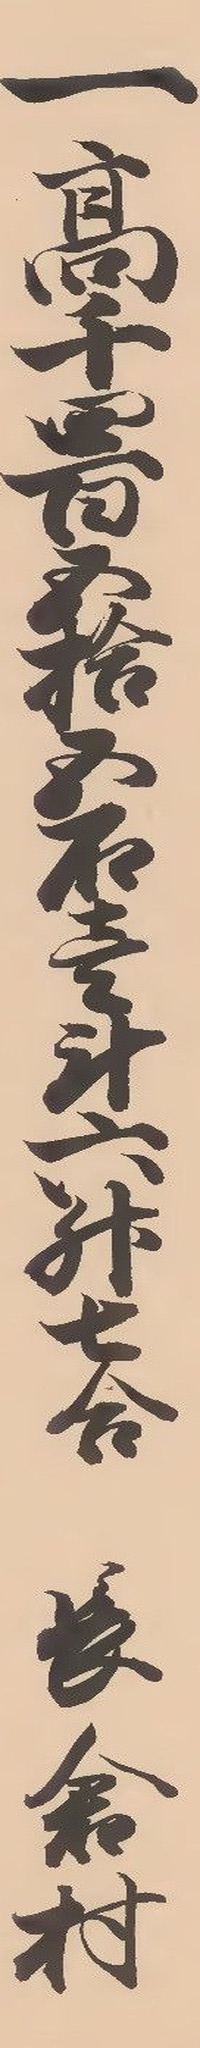一高壱千四百五拾五石壱斗六升七合長倉村
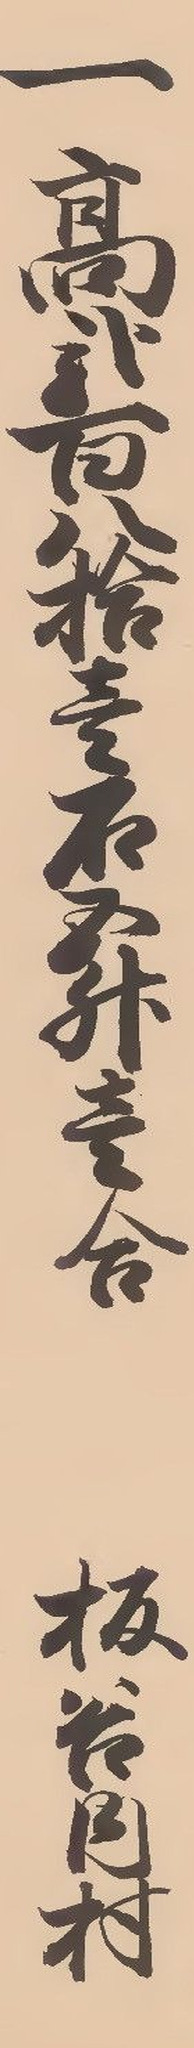一高弐百八拾壱石五升壱合板谷内村
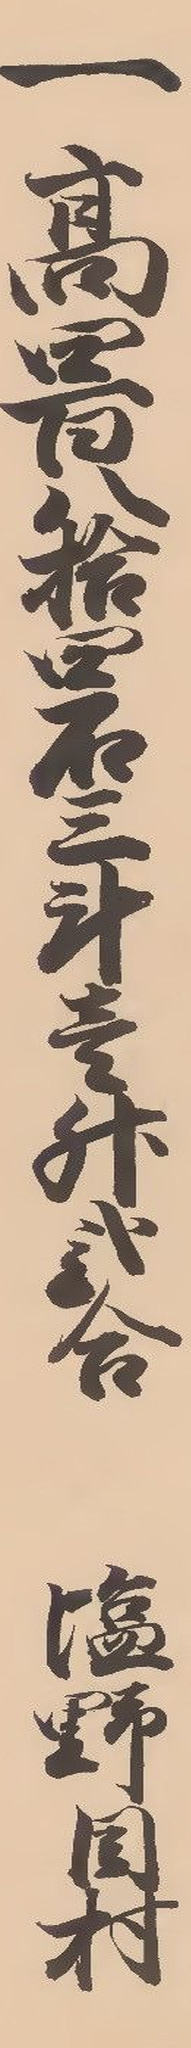一高四百八拾四石三斗壱升弐合塩野目村

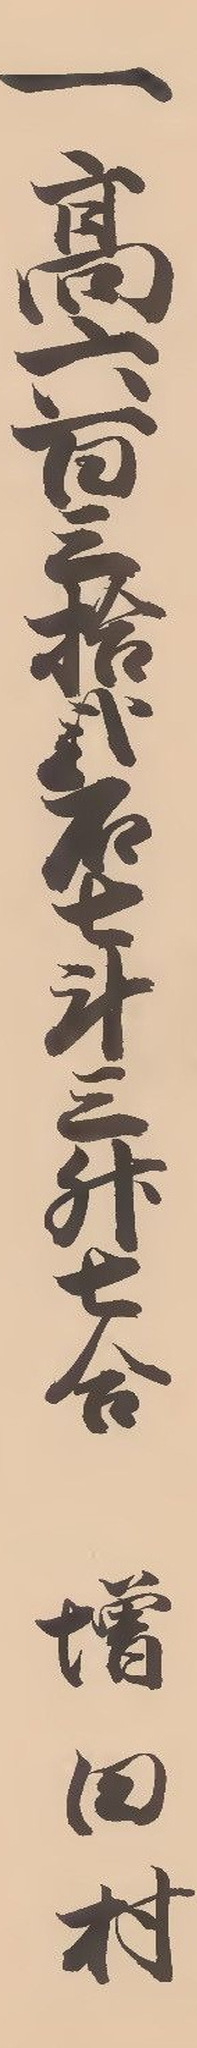一高六百三拾弐石七斗三升七合増田村
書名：陸奥国郷帳　４
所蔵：国立公文書館 National Archives of Japan
